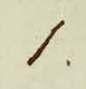1
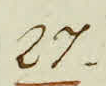27
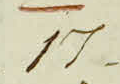17
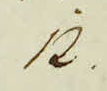12
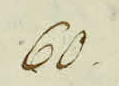60
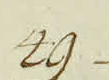49
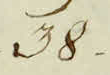38
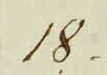18
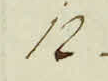12
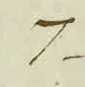7
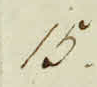15
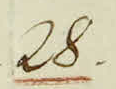28
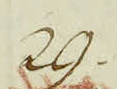29
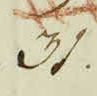31
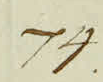74
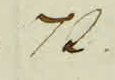72
